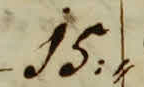15:
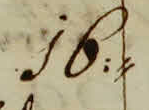16:
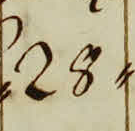28
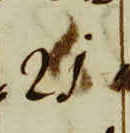21
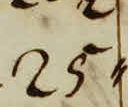25
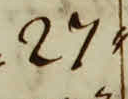27
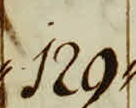129
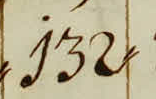132
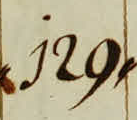129
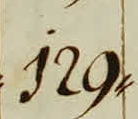129
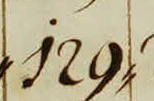129
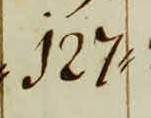127
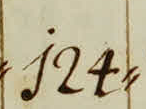124
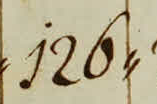126
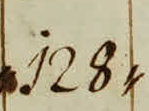128
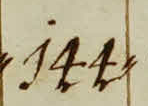144
